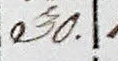30.
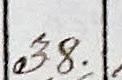38.
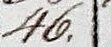46.
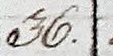36.
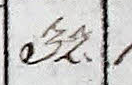32.
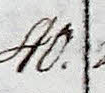40.
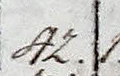42.
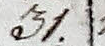31.
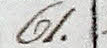61.
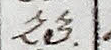23.
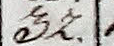32.
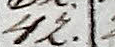42.
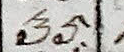35.
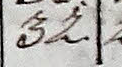32.
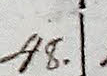48.
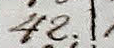42.
